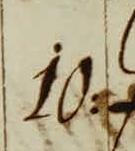10:
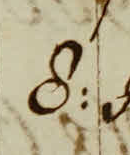8:
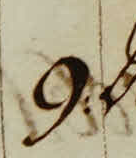9:
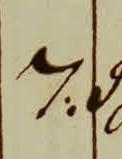7:
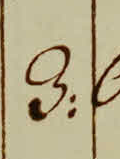3:
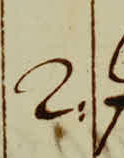2:
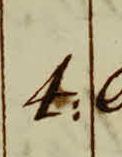4:
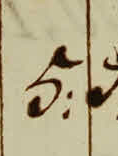5:
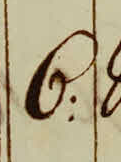6:
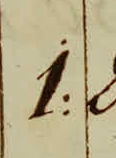1:
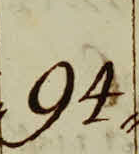94
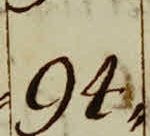94
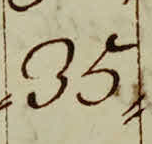35
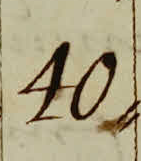40
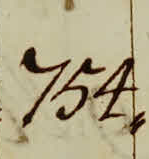754
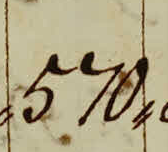570
